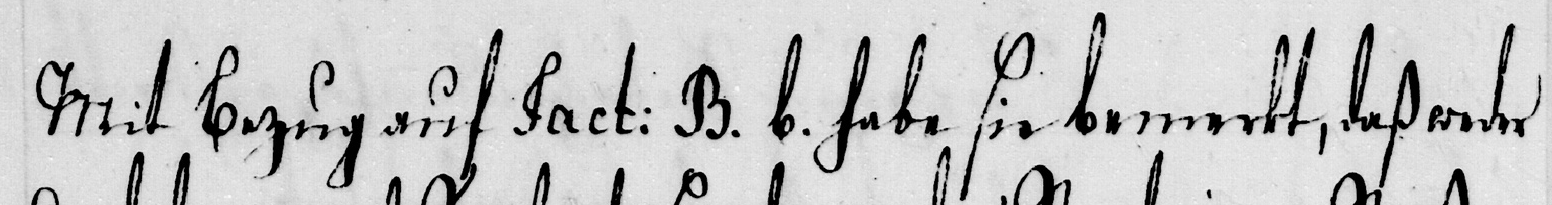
Mit Bezug auf Fact: B. b. habe sie bemerkt, daß we¬
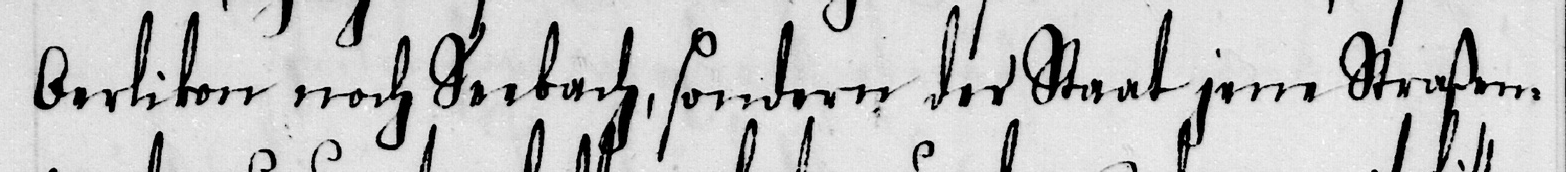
Oerlikon noch Seebach, sondern der Staat jene Straßen¬
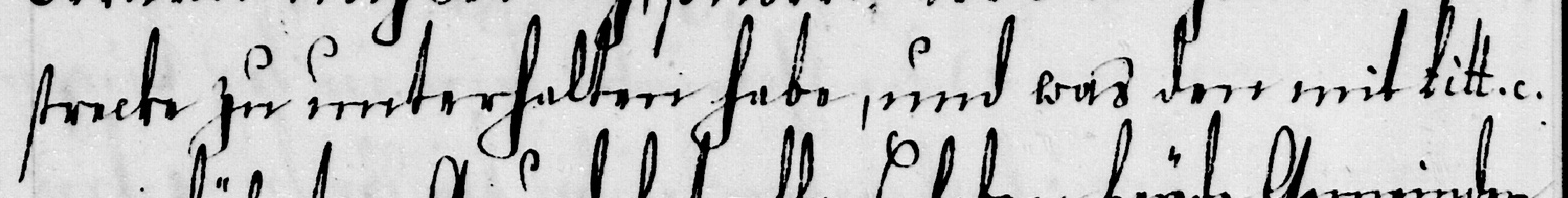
strecke zu unterhalten habe, und was den mit Litt.
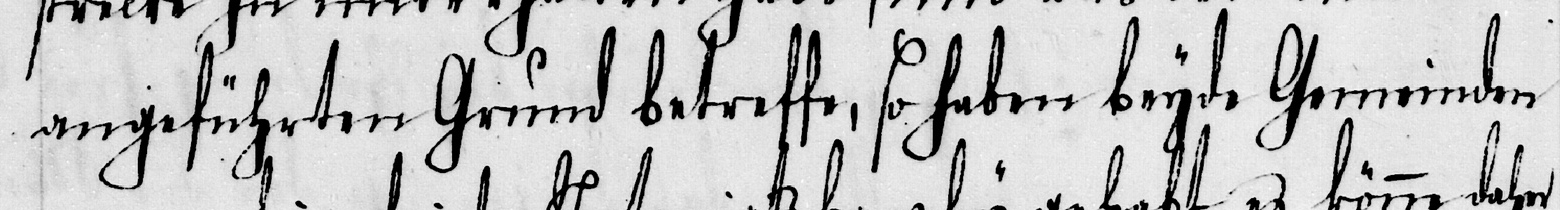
angeführten Grund betreffe, so haben beyde Gemeinden
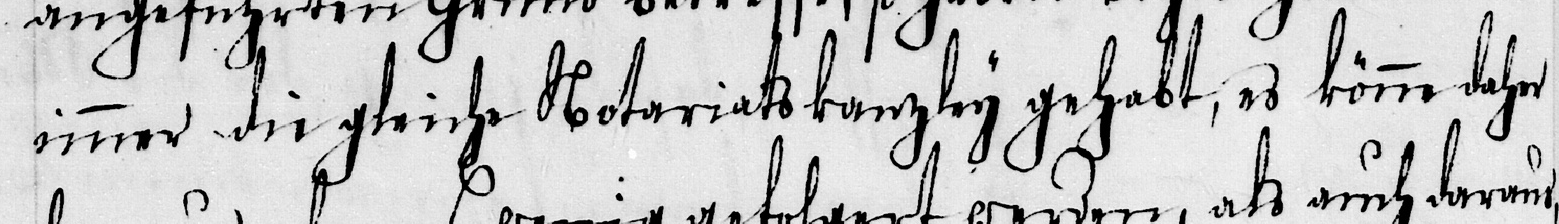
immer die gleiche Notariatskanzley gehabt, es könne daher
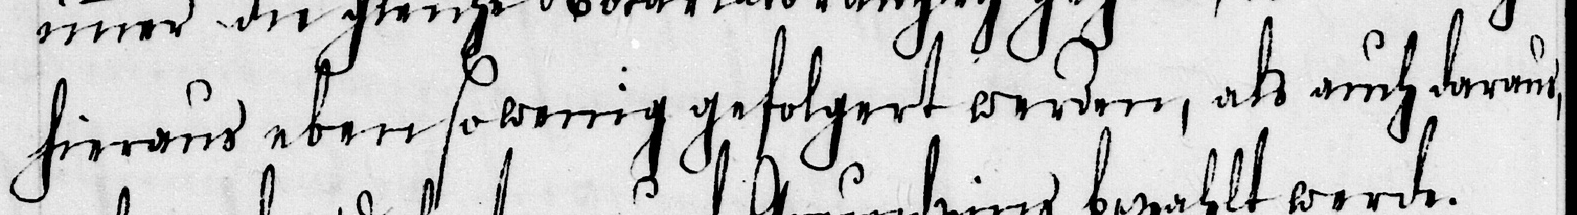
hieraus eben so wenig gefolgert werden, als auch daraus,
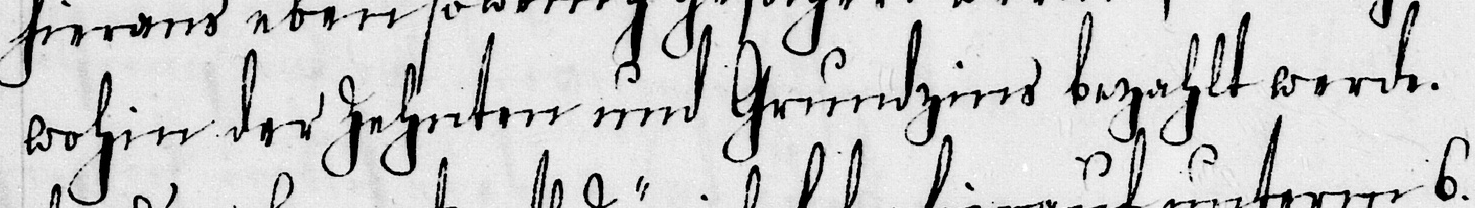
wohin der Zehnten und Grundzins bezahlt werde.
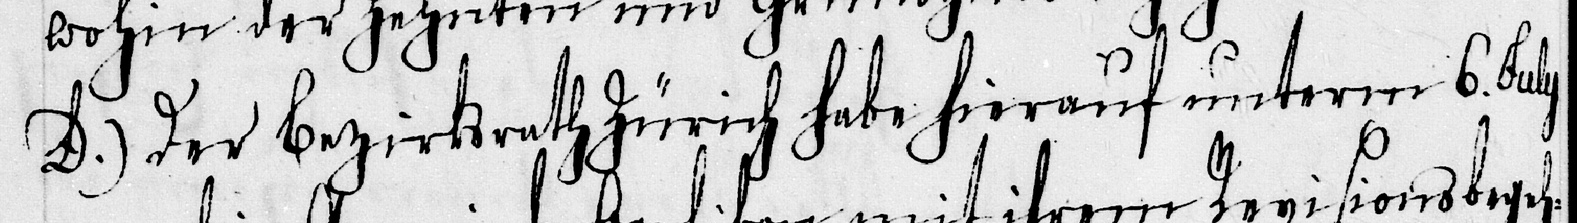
D.) Der Bezirksrath Zürich habe hierauf unterm 6. July
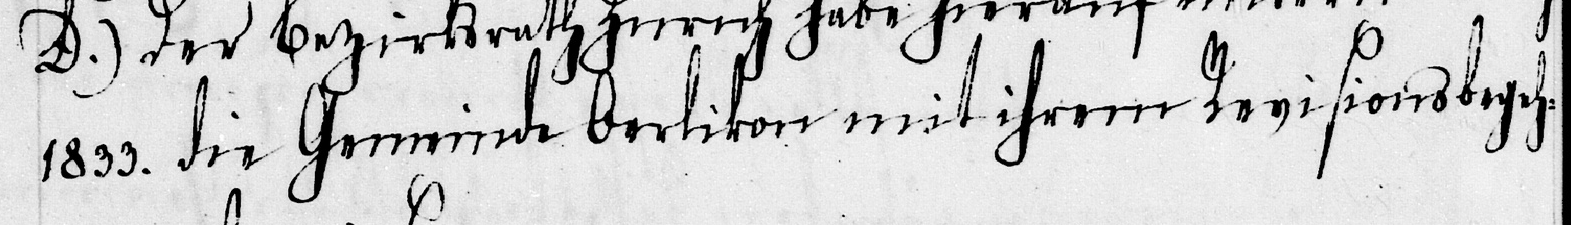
1833. die Gemeinde Oerlikon mit ihrem Revisionsbegeh¬
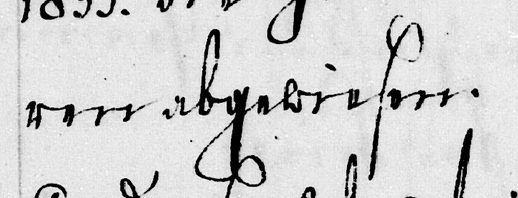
ren abgewiesen.
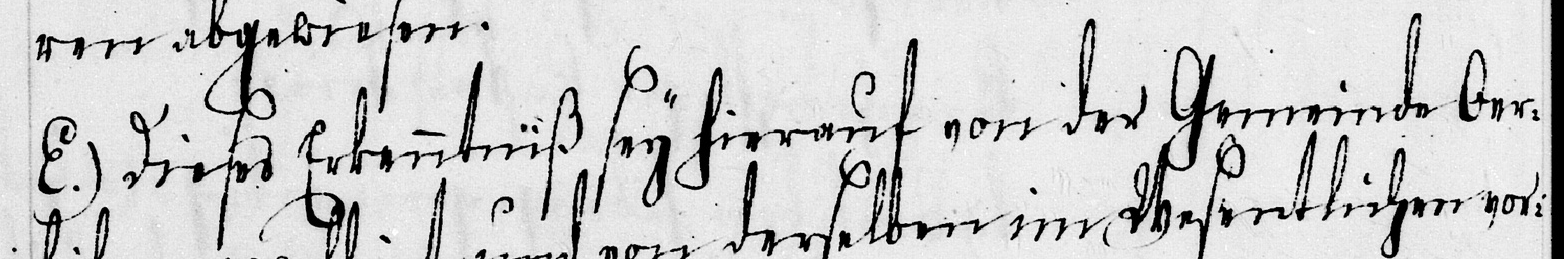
E.) Dieses Erkenntniß sey hierauf von der Gemeinde Oer¬
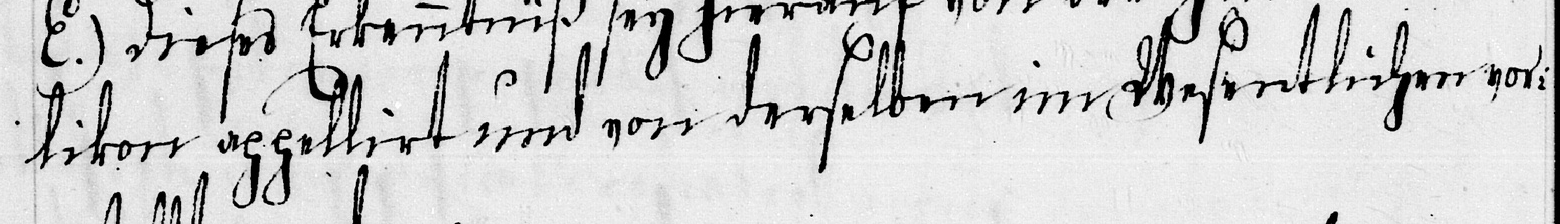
likon appellirt und von derselben im Wesentlichen v¬
